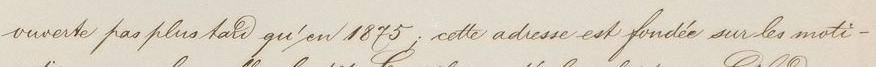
ouverte pas plus tard qu'en 1875; cette adresse est fondée sur les moti-
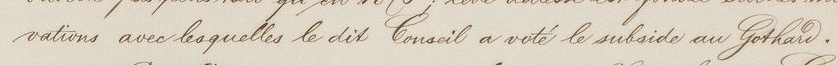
vations avec lesquelles le dit Conseil a voté le subside au Gothard.
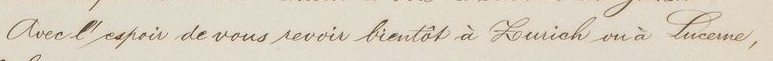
Avec l'espor de vous revoir bientôt à Zurich ou à Lucerne,
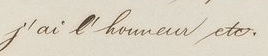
j'ai l'honneur etc.
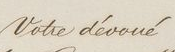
Votre dévoué
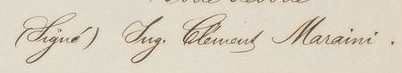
(Signé) Ing. Clément Maraini.
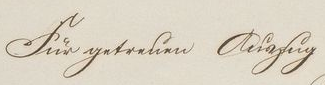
Für getreuen Auszug
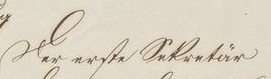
Der erste Sekretär
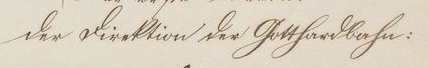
der Direction der Gotthardbahn:
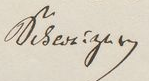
Schweizer
